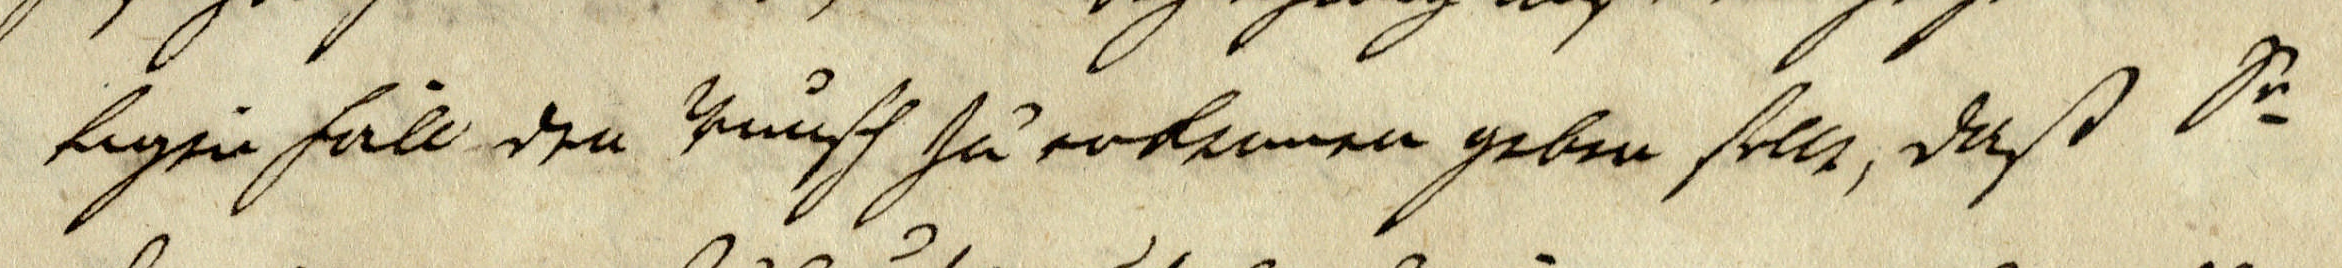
tigen Fall den Wunsch zu erkennen geben solle, daß Sr.
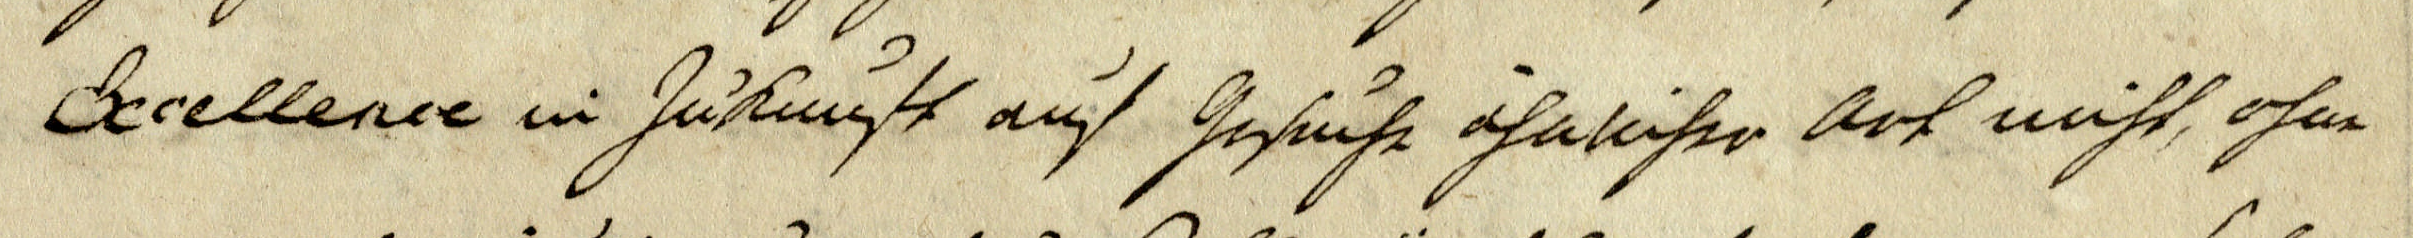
Excellence in Zukunft auf Gesuche ähnlicher Art nicht, ohne
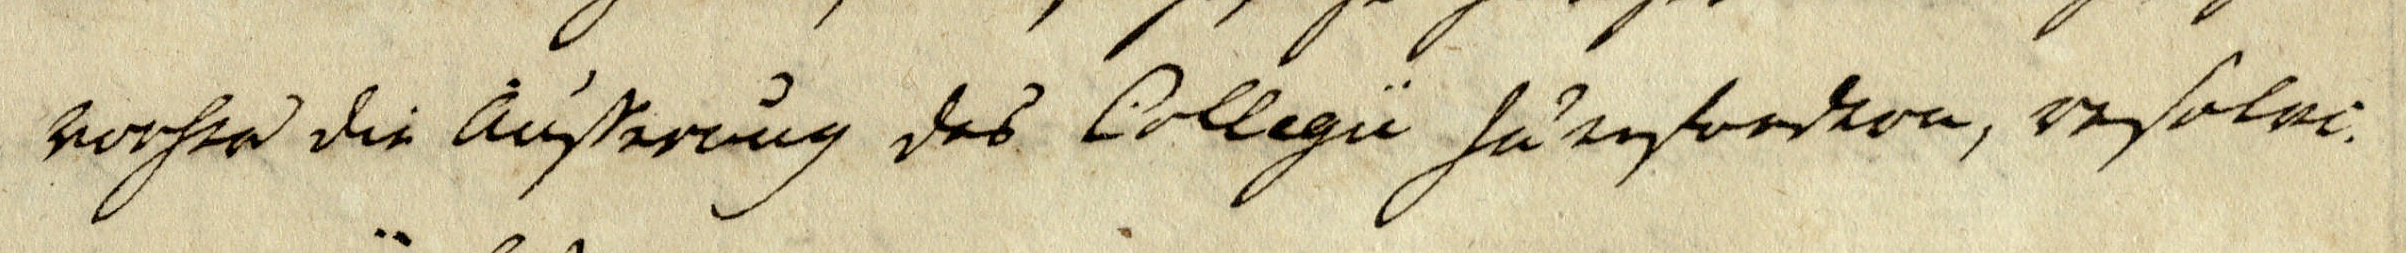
vorher die Äusserung des Collegii zu erfordern, resolvi¬
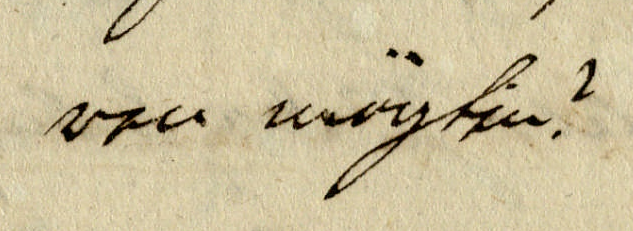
ren mögten?
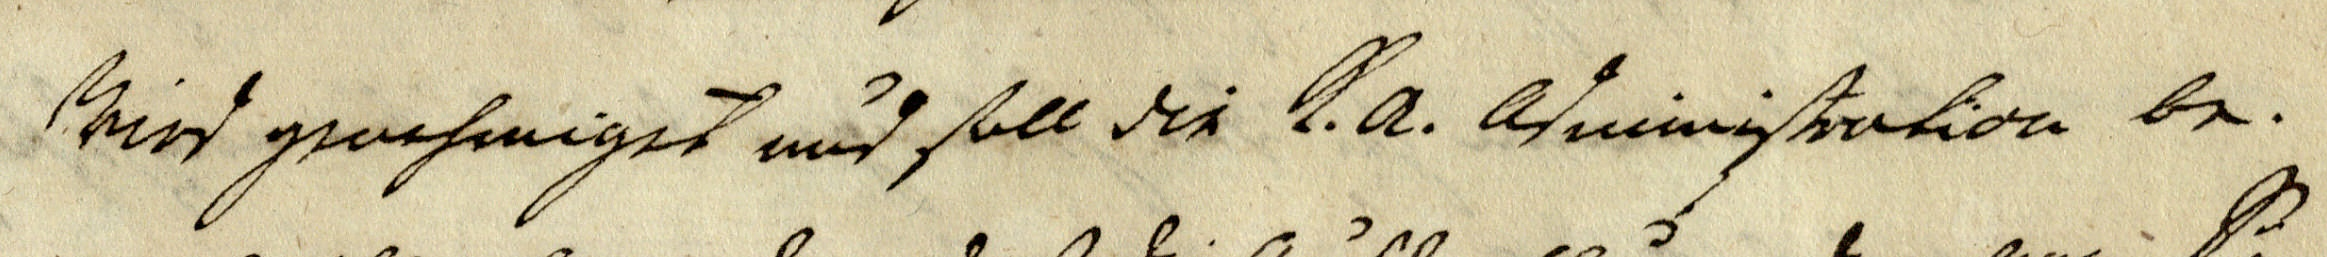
Wird genehmiget und soll die K. A. Administration be¬
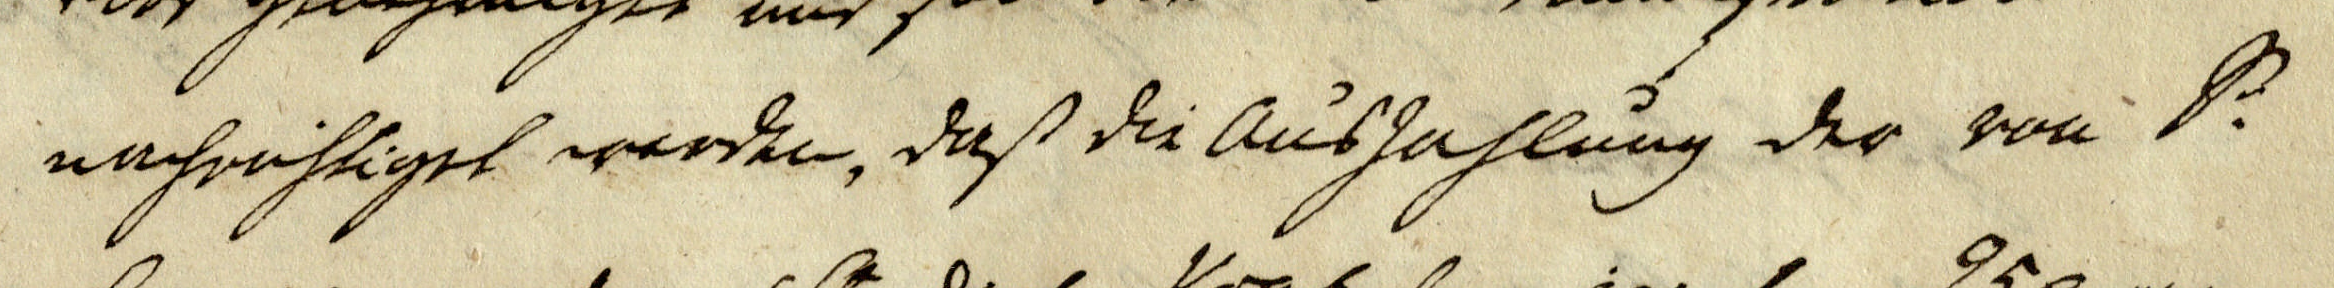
nachrichtiget werden, daß die Auszahlung der von S.
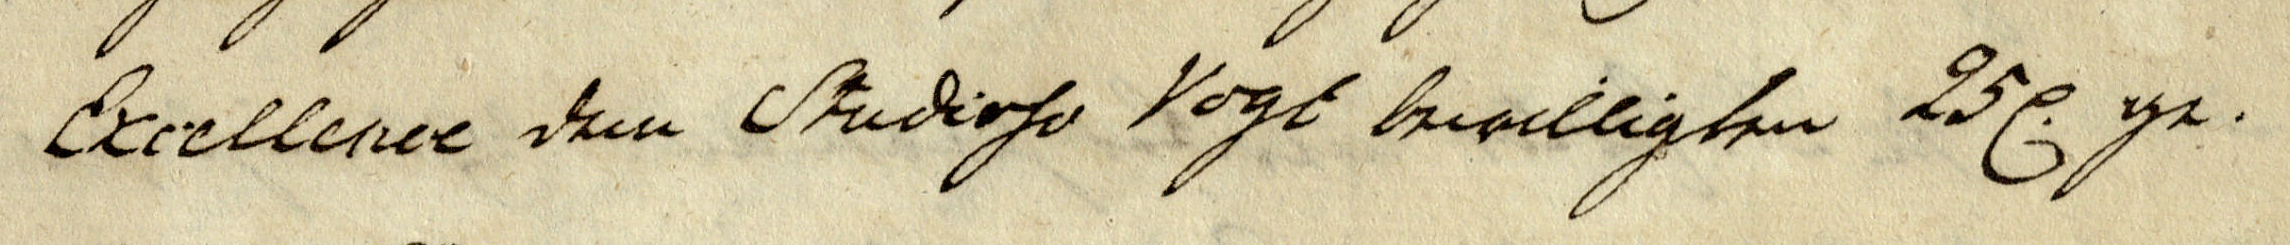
Excellence dem Studioso Vogt bewilligten 25 l ge¬
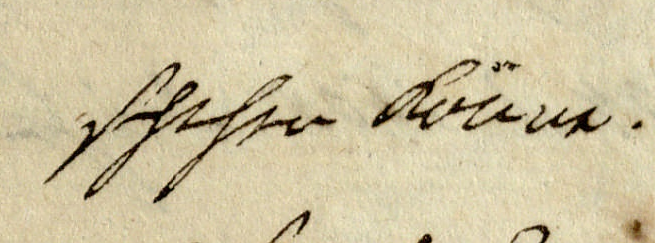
schehen könne.
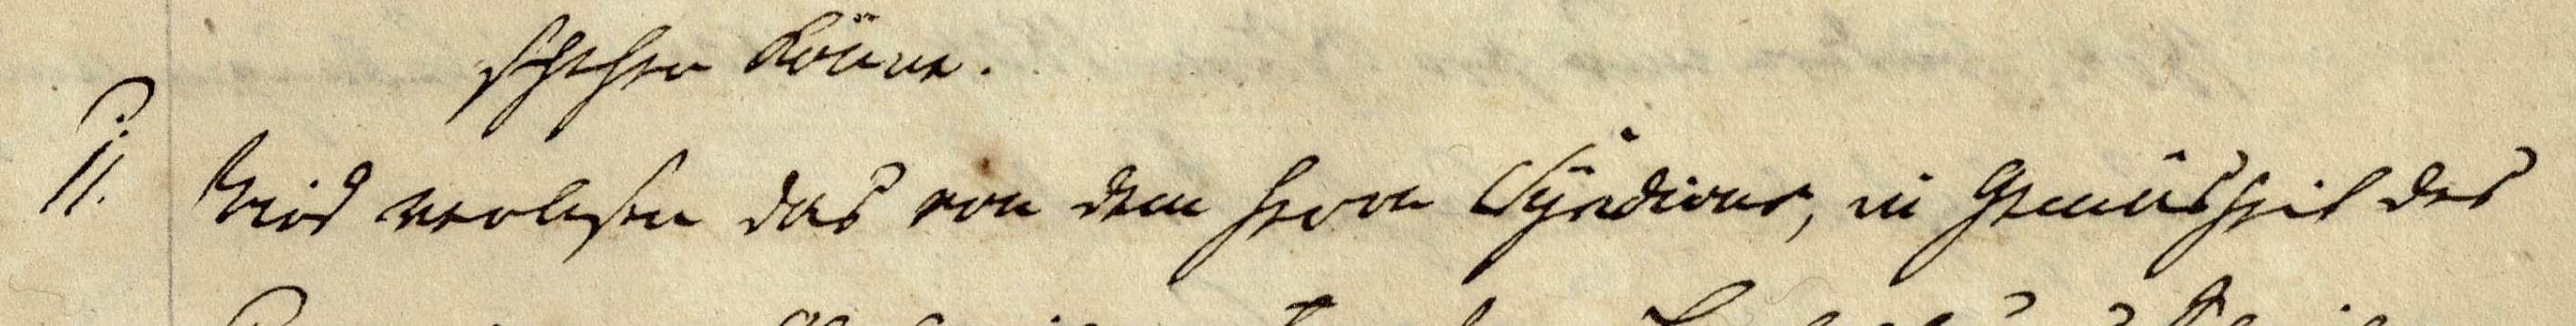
11. Wird verlesen das von dem Herrn Sÿndicus, in Gemäsheit des
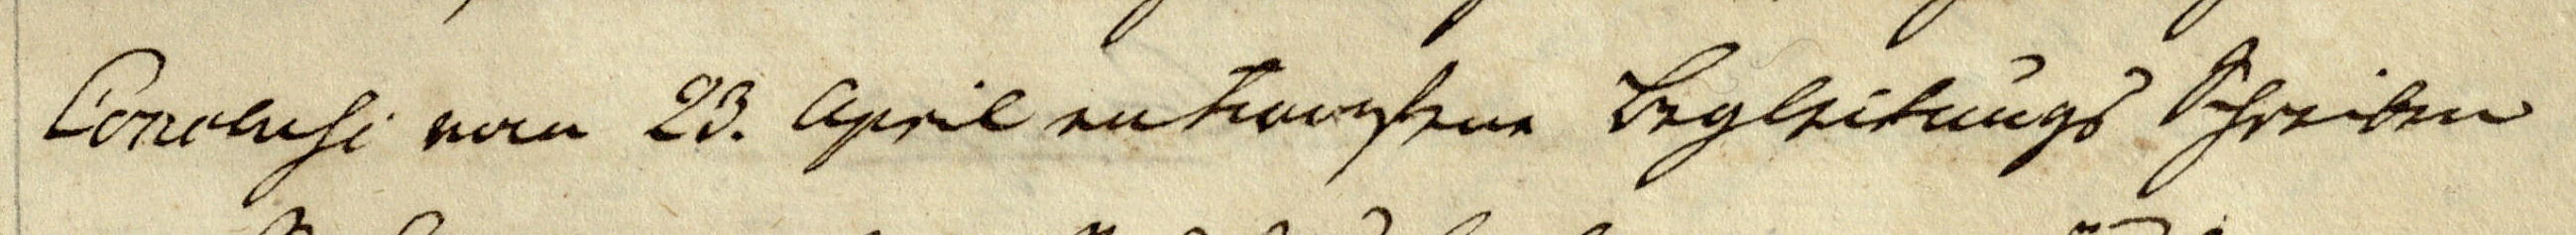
Conclusi vom 23. April entworfene Begleitungs Schreiben
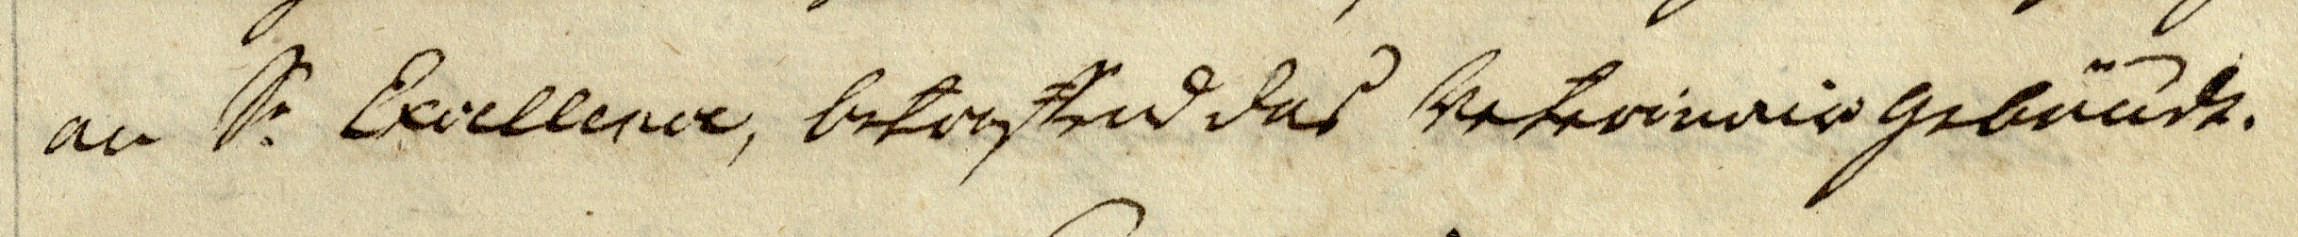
an Sr Excellence, betreffend das Veterinairgebäude.
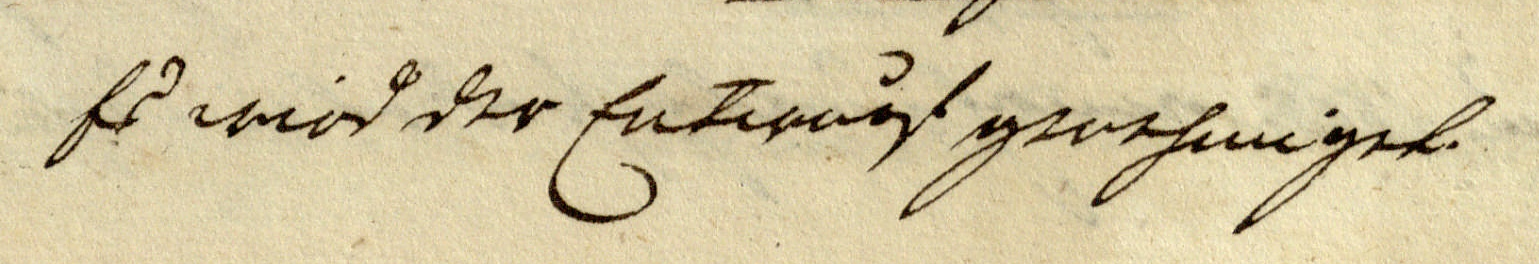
Es wird der Entwurf genehmiget
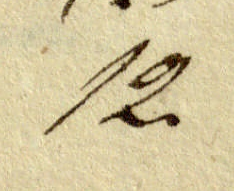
12.
